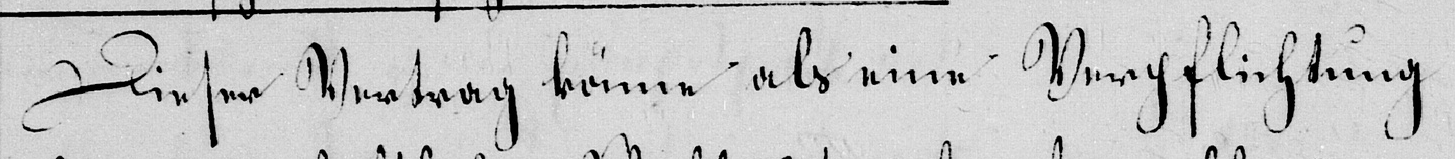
Dieser Vertrag könne als eine Verpflichtung
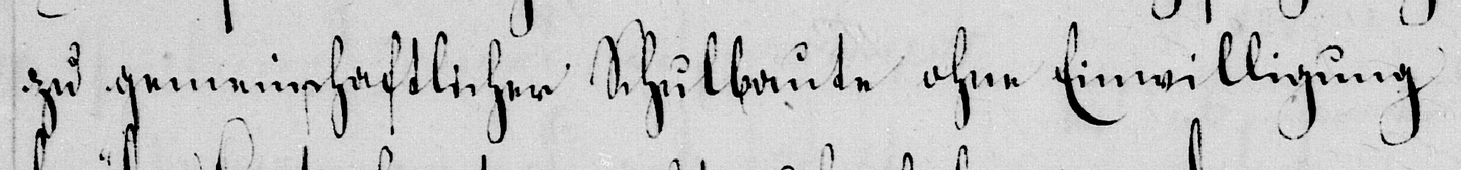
zu gemeinschaftlicher Schulbaute ohne Einwilligung
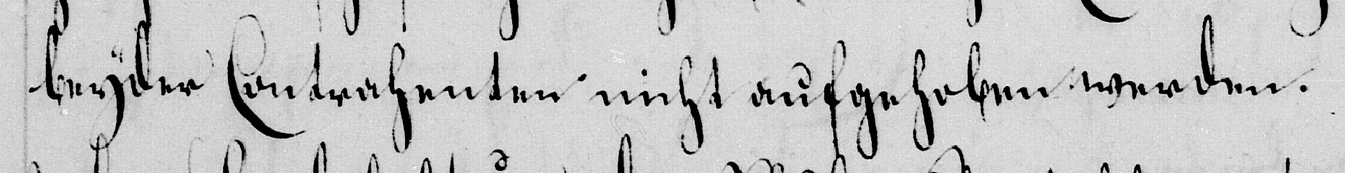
beyder Contrahenten nicht aufgehoben werden.
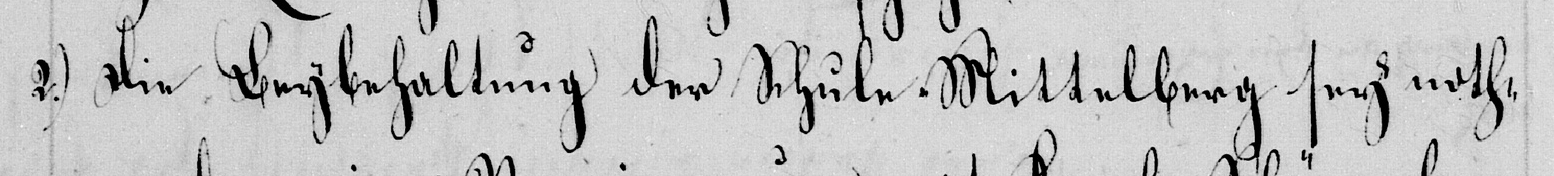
2.) Die Beybehaltung der Schule-Mittelberg sey noth¬
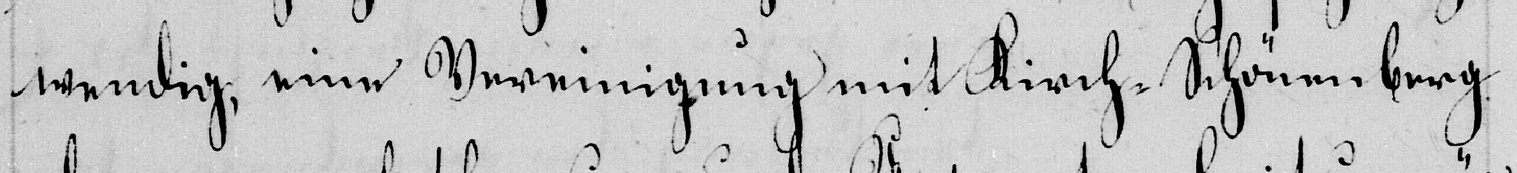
wendig, eine Vereinigung mit Kirch-Schönenberg
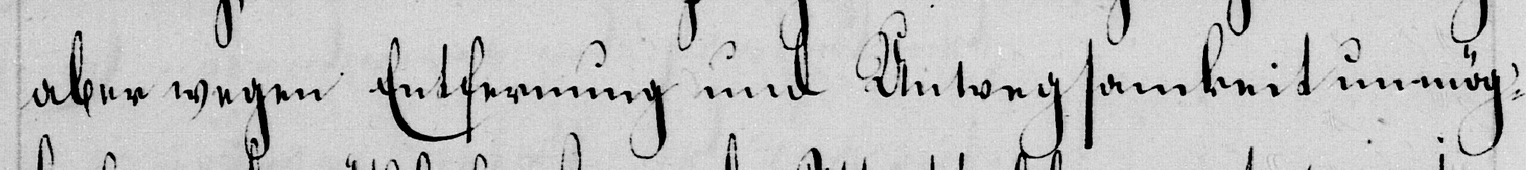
aber wegen Entfernung und Unwegsamkeit unmög¬
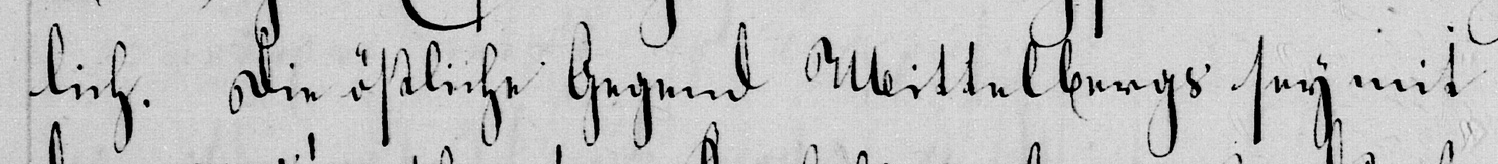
lich. Die östliche Gegend Mittelbergs sey mit
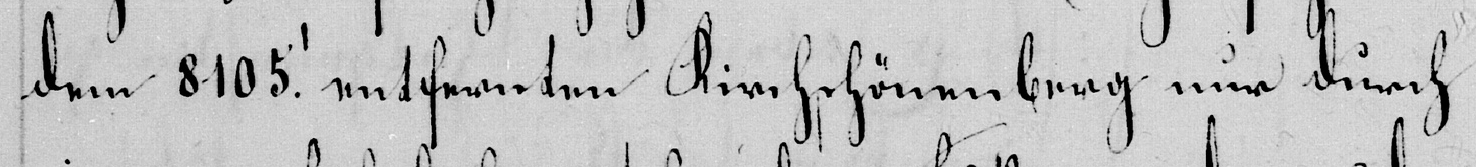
dem 8104. [Fuß] entfernten Kirchschönenberg nur durch
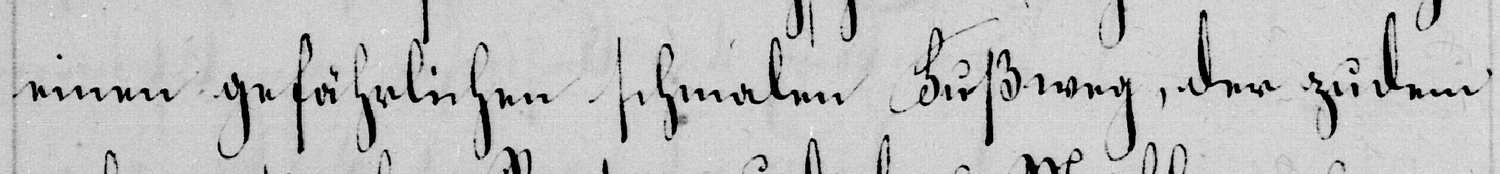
einen gefährlichen schmalen Fußweg, der zudem
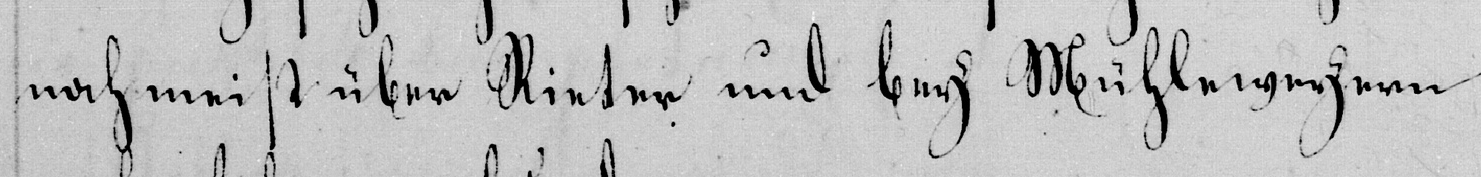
noch meist über Rieter und bey Mühleweyern
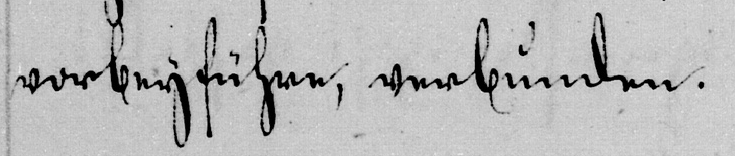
vorbeyführe, verbunden.
